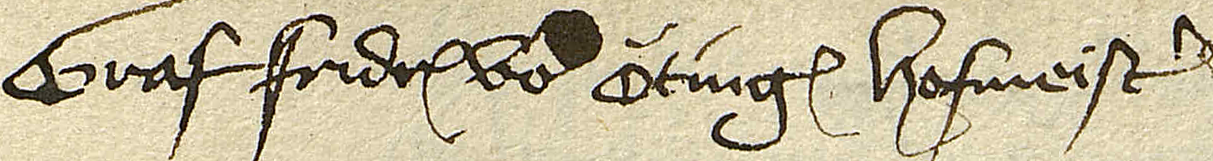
Graf fridr* vo* Öting* hofmeiſt*
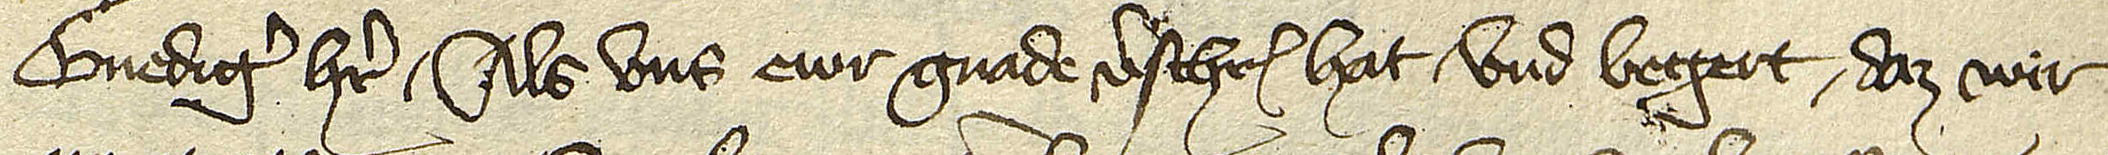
Gnedig* hr* / Als vns ewr gnade v*ſchr* hat / vnd begert / daʒ wir
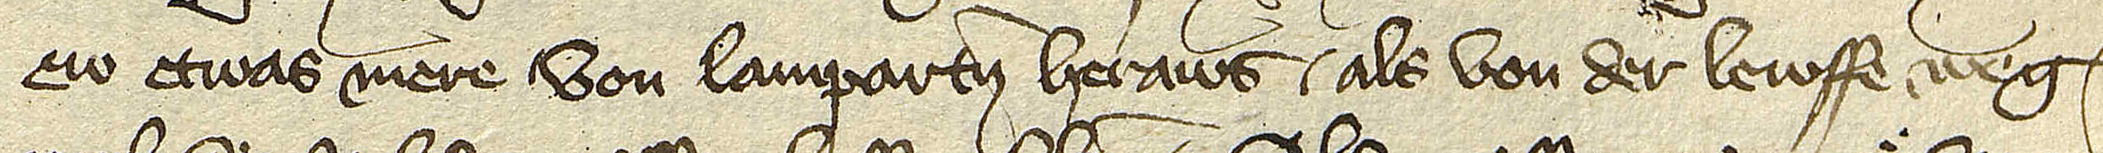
ew etwas mere / von lampartn* heraws / als von der lewffe weg*
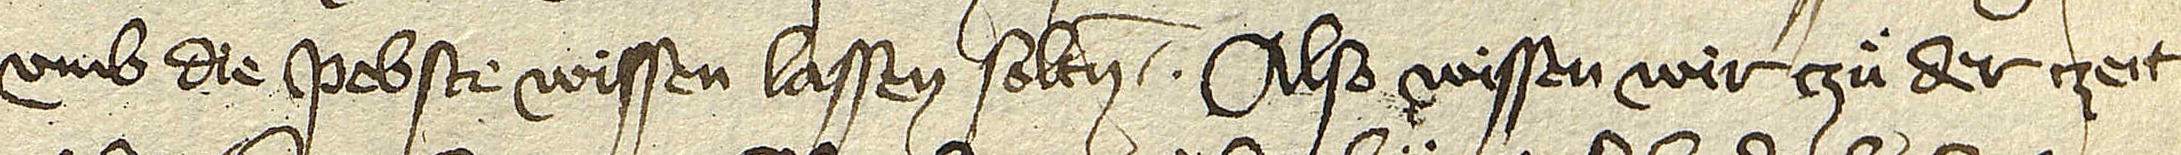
vmb die Pebſte wiſſen laſſen ſoltn* / . Alſo wiſſen wir cʒü der cʒeit
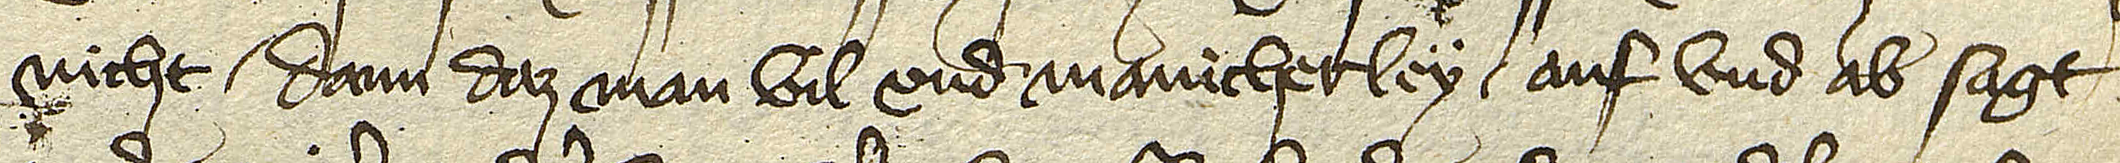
nicht / dann daʒ man vil vnd manicherley / auf vnd ab ſagt
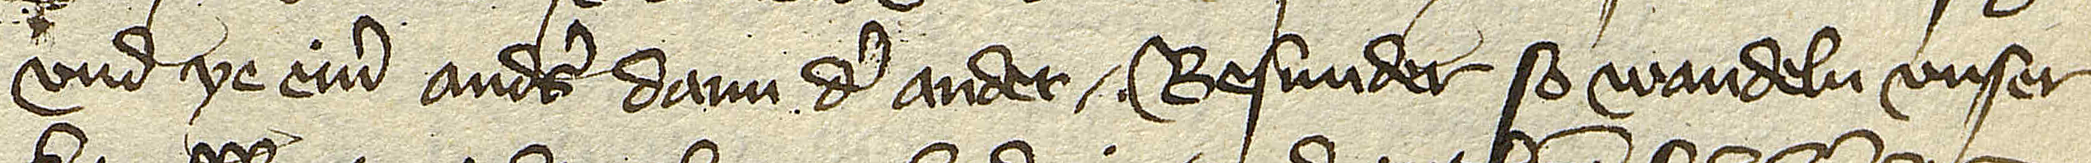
vnd ye ein* ands* dann d* ander / . Beſunder ſo wandeln vnſer
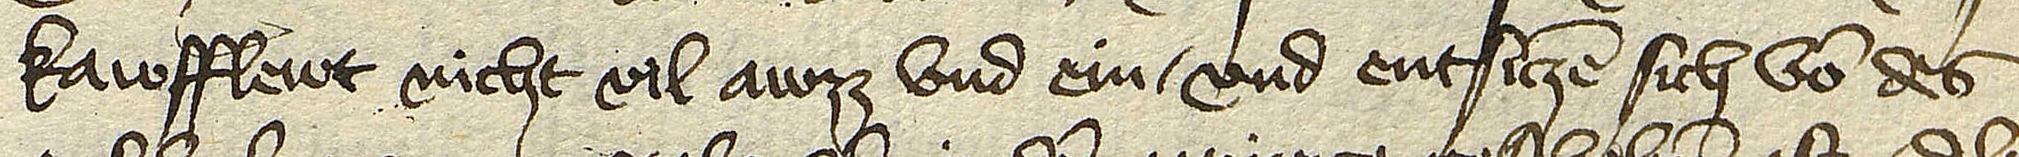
kawfflewt nicht vil awʒʒ vnd ein / vnd entſicʒe* ſich vo* des
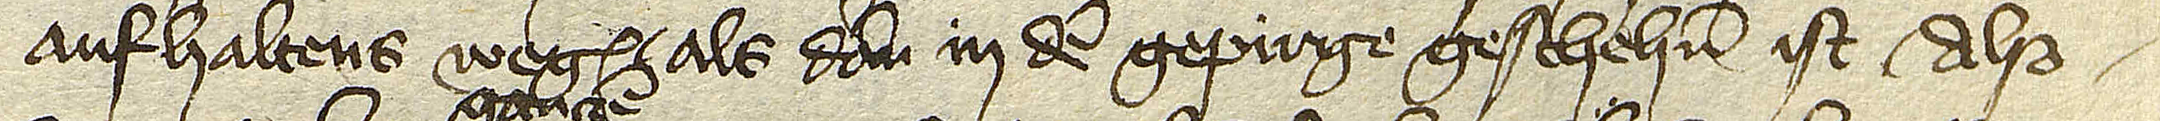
aufhaltens weg* / als dan* in d* gepirge geſchehn* iſt / Alſo /
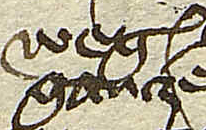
gancʒe*
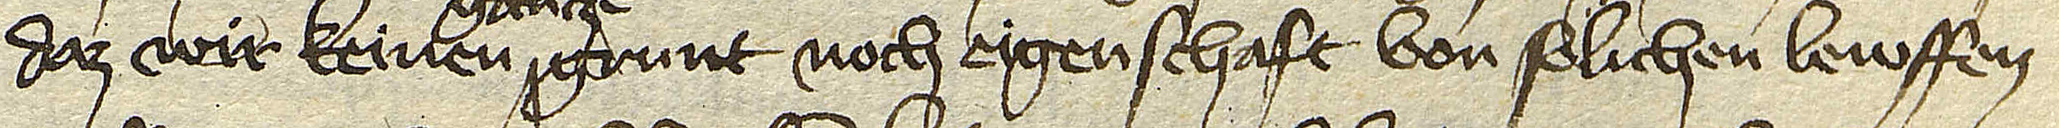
daʒ wir keinen grunt noch eigenſchaft von ſölichen lewffen
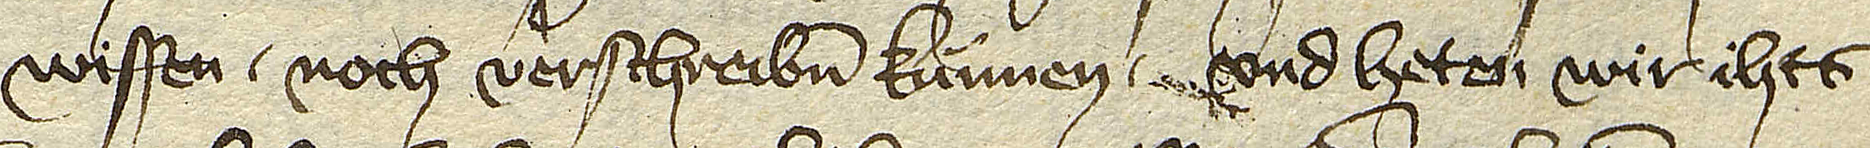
wiſſen / noch verſchreibn* künnen / vnd heten wir ihts
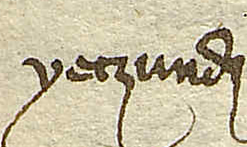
yecʒund*
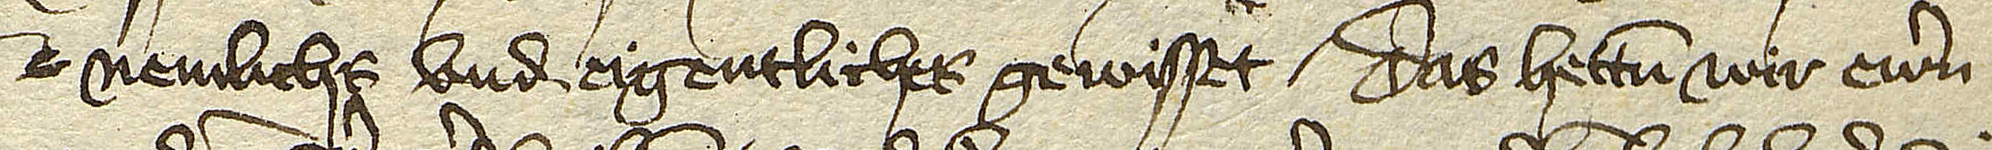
% nemlichs vnd eigentliches gewiſſet / Das hettn* wir ew*n
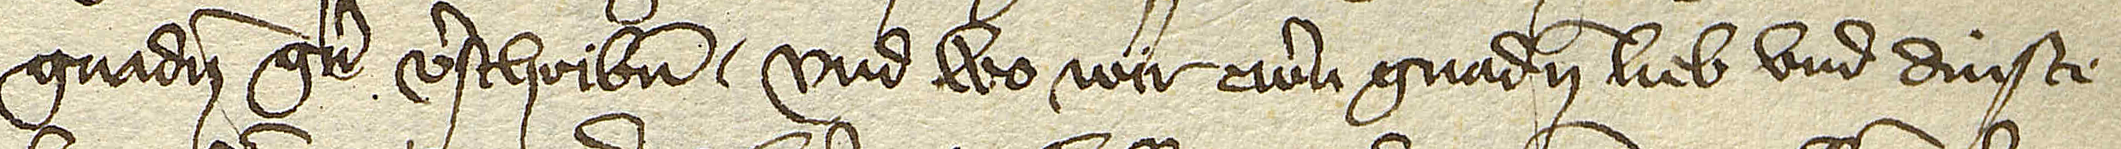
gnadn* gn* v*ſchribn* / vnd wo wir ew*n gnadn* lieb vnd dinſte
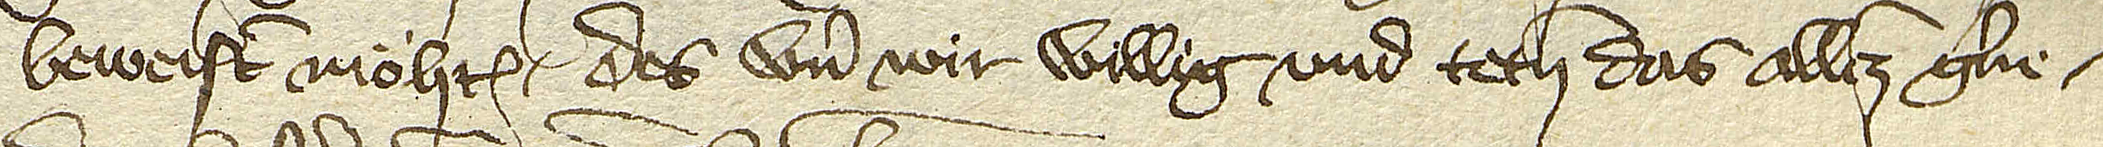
beweiſe* möht* / Des wn* wir willig vnd tetn* das allcʒ* g*ne /
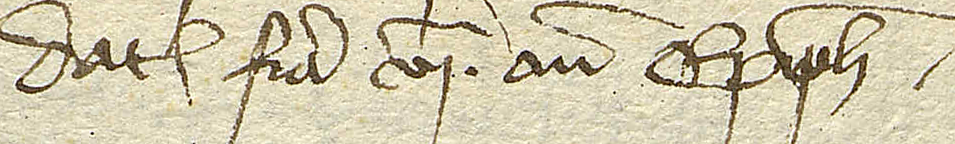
dat* fia*vi* . an* Ep*ph /
